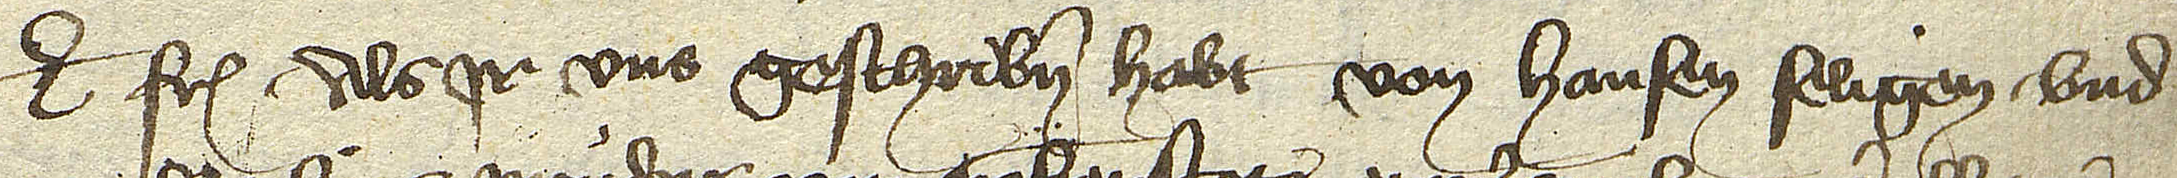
L* fr* / Als Ir vns geſchribn* habt von hanſen ſeligen / vnd
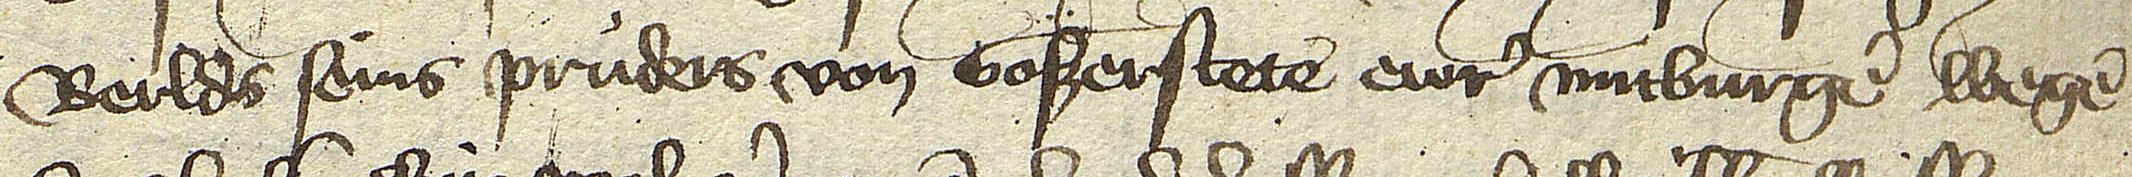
Berlds ſeins prüders von Goſʒerſtete* ewr* mitburge* wege*
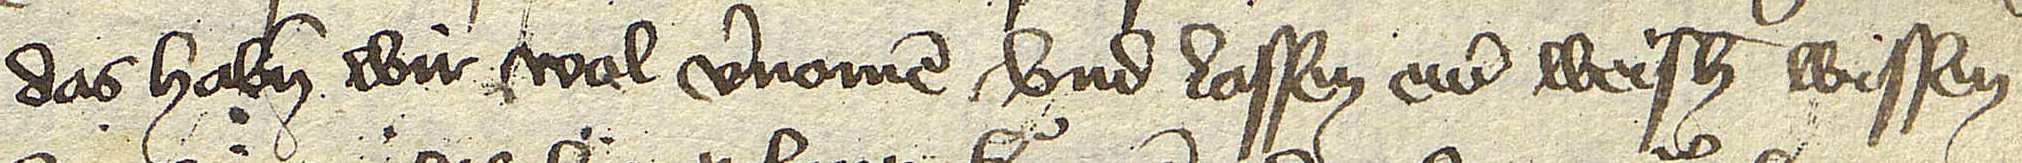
das habn* wir wol v*nome* / vnd laſſen ew* weiſh* wiſſen
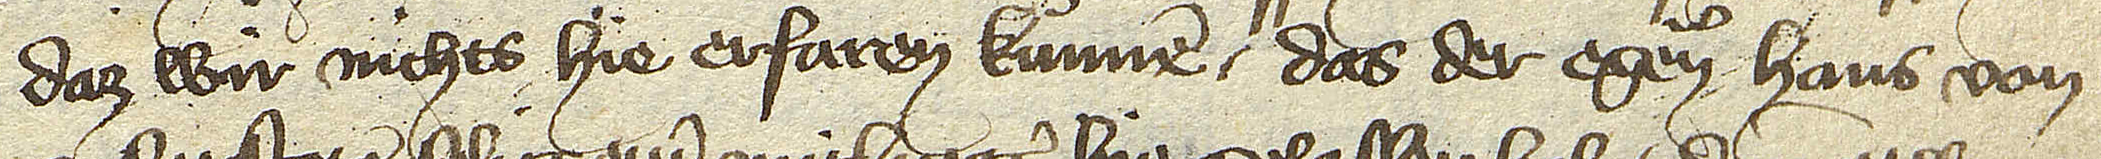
daʒ wir nichts hie erfaren künne* / das der egen* hans von
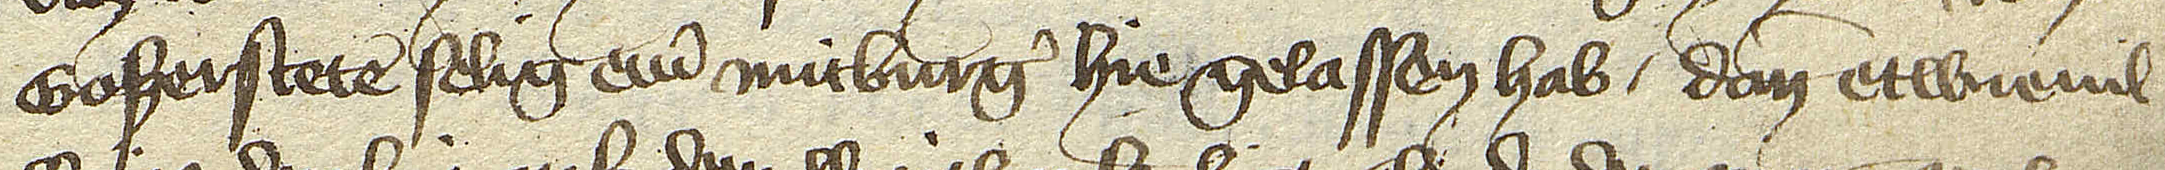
Goſʒerſtete ſelig ew* mitburg* hie gelaſſen hab / dan* etwieuil
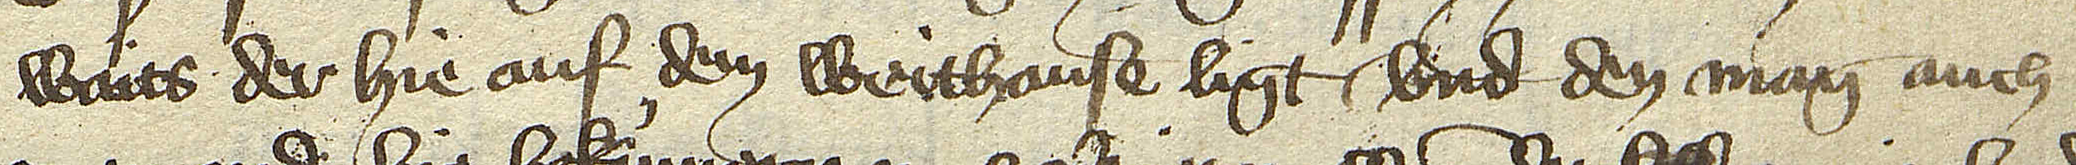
waits der hie auf dem weithauſe ligt / vnd den mag auch
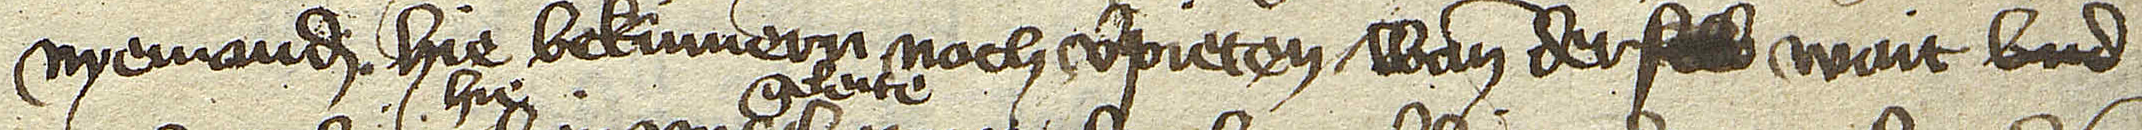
nyemand* hie bekümern noch v*pieten / wan* derſelb wait vnd
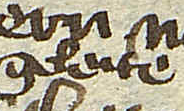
geleite
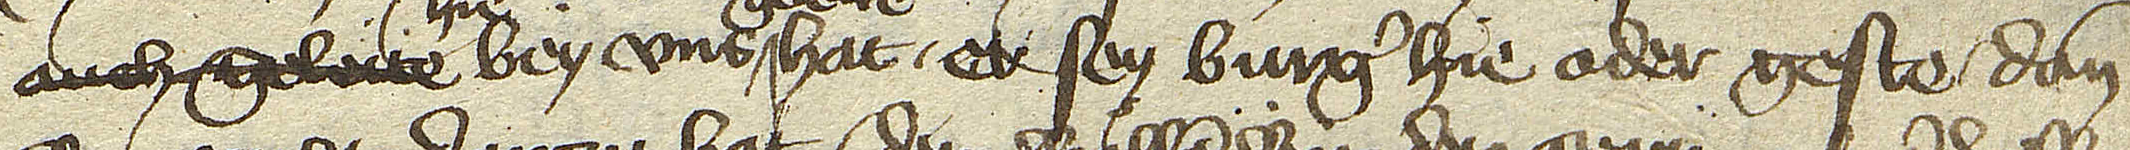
auch geleite bey vns hat / er ſey burg* hie oder geſte / dan*
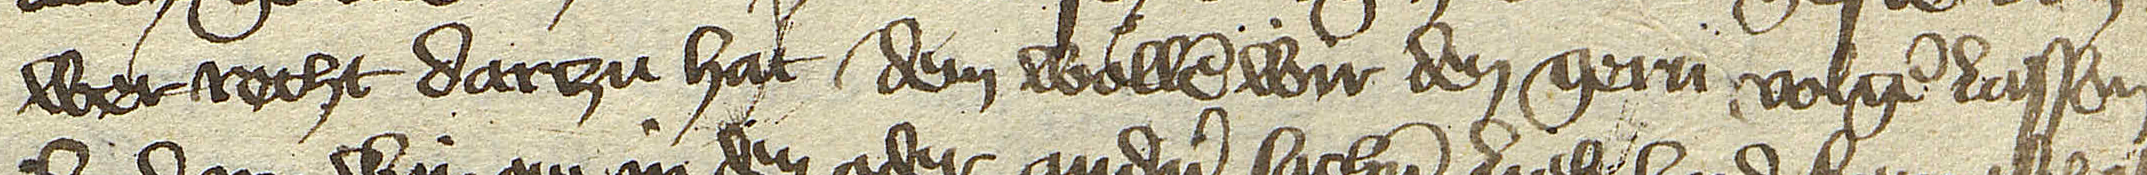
wer recht darcʒu hat / dem wölle* wir den gern volge* laſſen
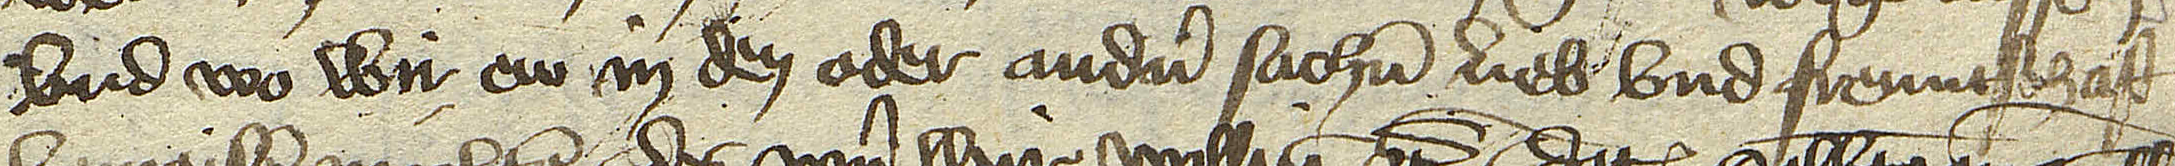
vnd wo wir ew in den oder andn* ſachn* lieb vnd freuntſchaft
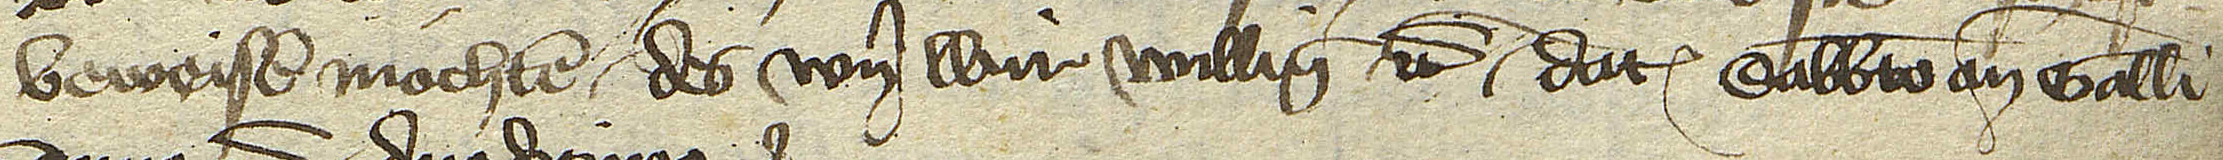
beweiſe* möchte* / des wn* wir willig ec* / dat* Sabbto* an* Galli
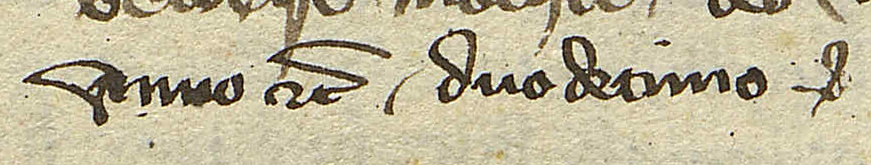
Anno ec* duodecimo §
